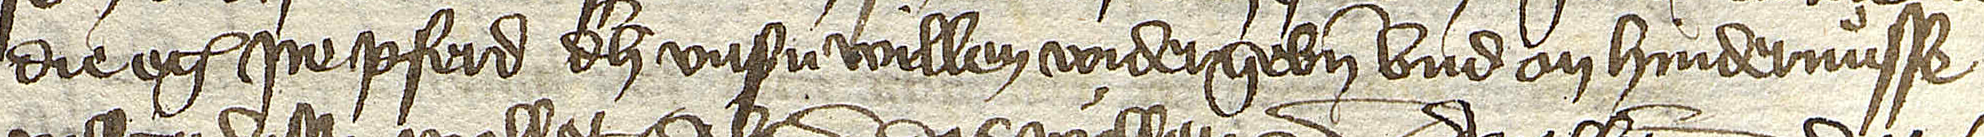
die eg* Ire pferd d*h vnſ*n willen widergebn* vnd on hindernüſſe
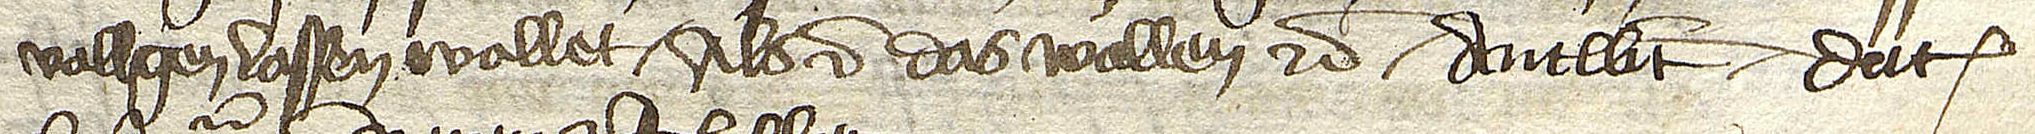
vollgen laſſen wollet / Als ec* das wöllen ec* / Antw*t / Dat*
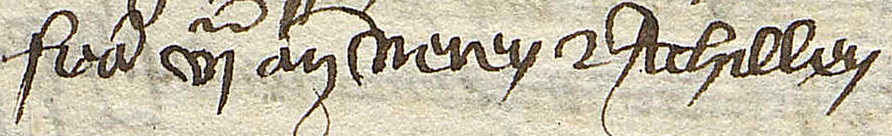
fea* vi* an* Nerey @ Achilley
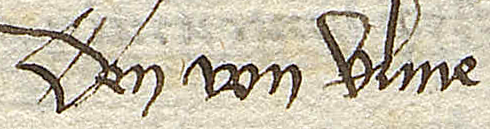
Den von Vlme
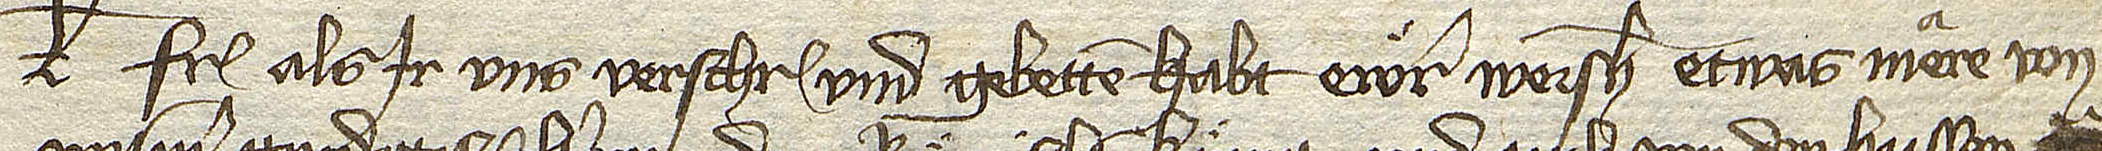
L* fr* als Ir vns verſchr* vnd gebette* habt eẅr* weiſh* etwas mëre von
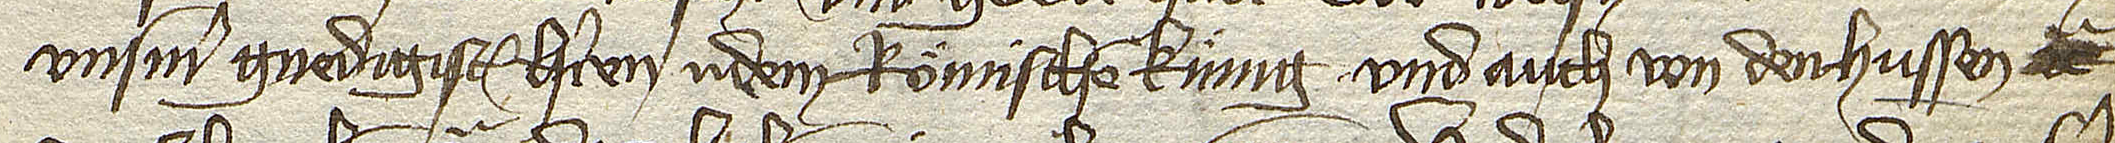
vnſm* gnedigiſt* h*ren ~ dem Römiſche* künig / vnd auch von den huſſen ec*
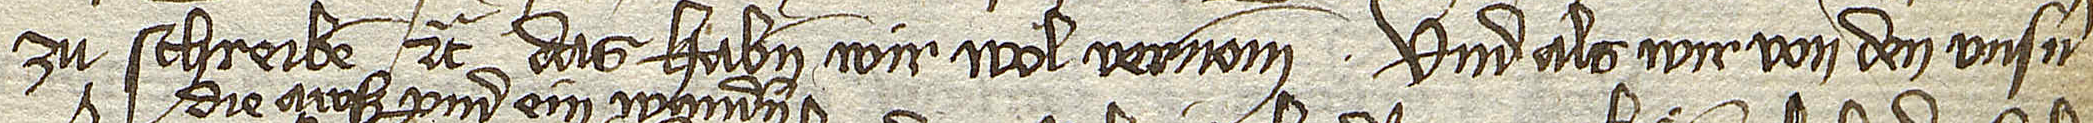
ʒu ſchreibe* ec* das habn* wir wol vernom* . Vnd als wir von den vnſn*
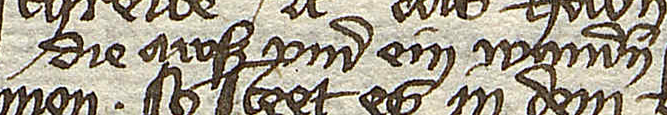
die awſʒ vnd ein wand*n
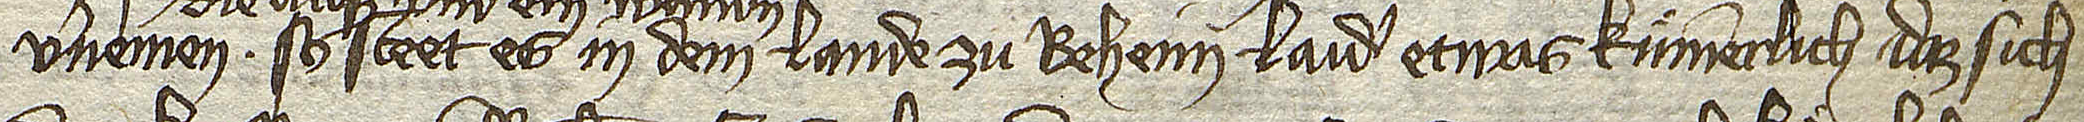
v*nemen . ſo ſteet es in dem lande ʒu Beheim laid* etwas küm*erlich / daʒ ſich
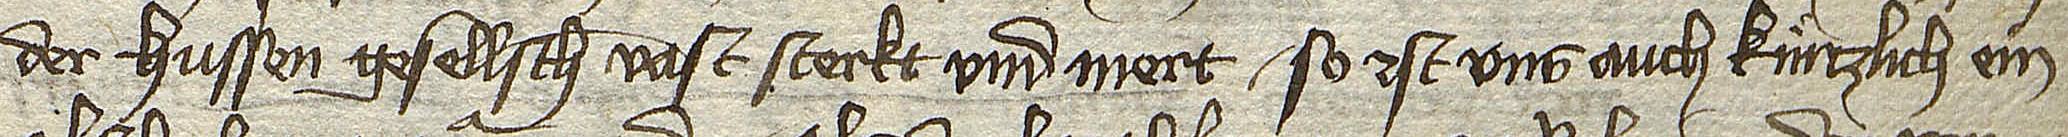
der huſſen geſellſch* vaſt ſterkt vnd mert / ſo iſt vns auch kürcʒlich ein
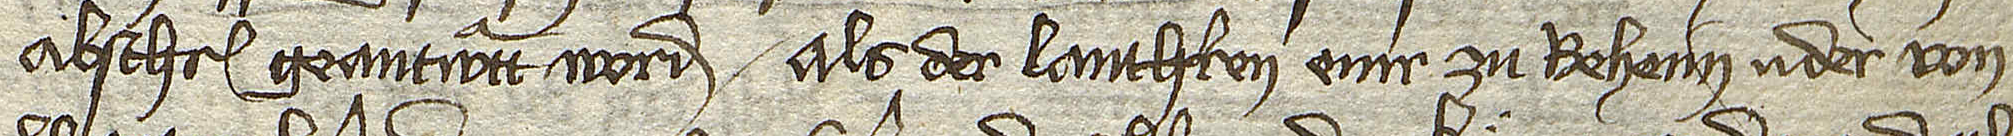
abſchr* geantw*tt word* / als der lanth*ren einr ʒu Beheim ~ der von
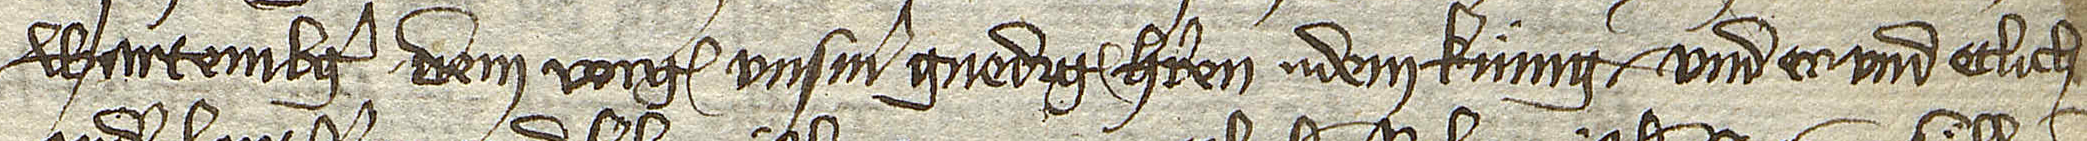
wartemb*g / Dem vorg* vnſm* gnedig* h*ren ~ dem künig / vnd er vnd etlich
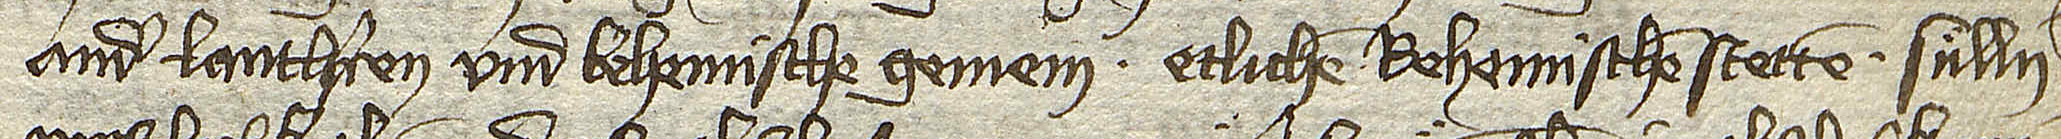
and* lanth*ren vnd behemiſche gemein . etliche* Behemiſche* ſtette* . ſülln*
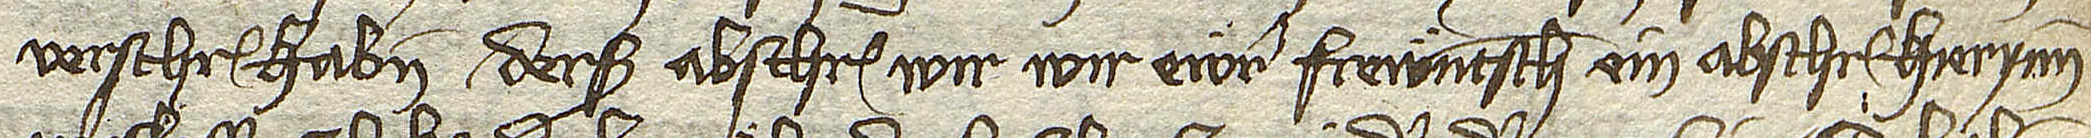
verſchr* habn* / derſ* abſchr* wir wir eẅr* freẅntſch* ein abſchr* hierynn*
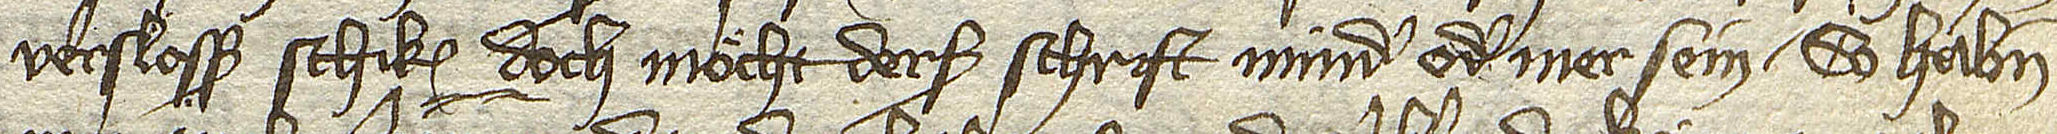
verſloſſ* ſchik* doch möcht derſ* ſchrift mind* od* mer ſein / So habn*
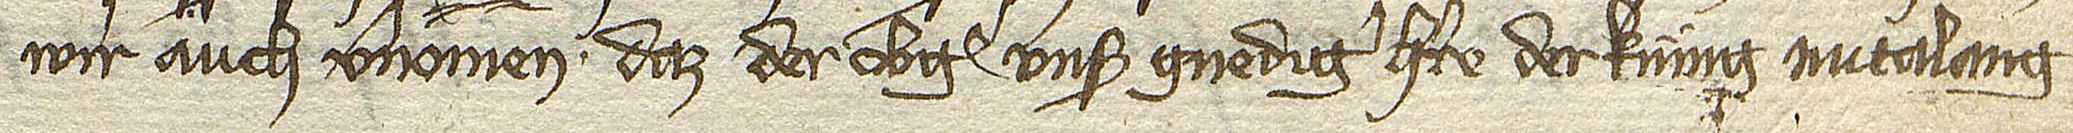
wir auch v*nom*en . daʒ der obg* vnſ* gnedig* h*re der künig %%talang
